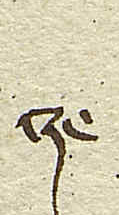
cʒe
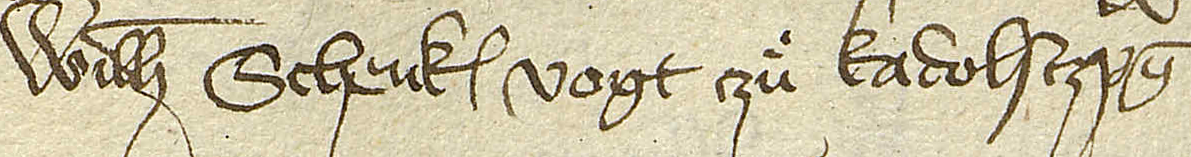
Wilh* Schenk* vogt cʒü kadolſcʒp*g
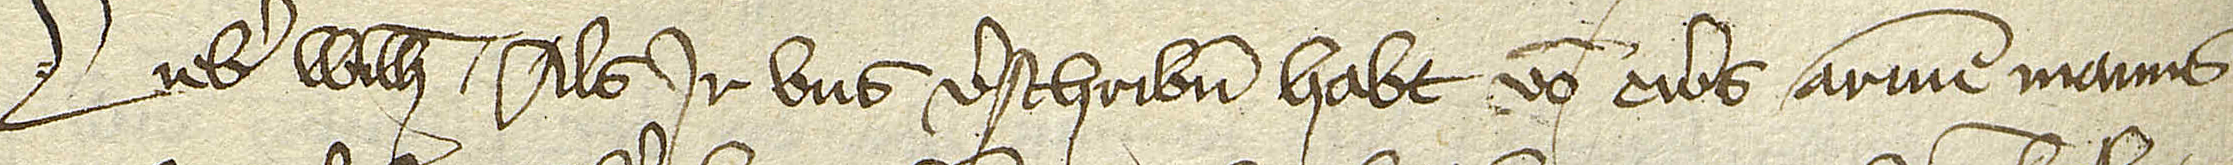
Lieb* Wilh* / Als Ir vns v*ſchribn* habt vo* ew*s arme* manns
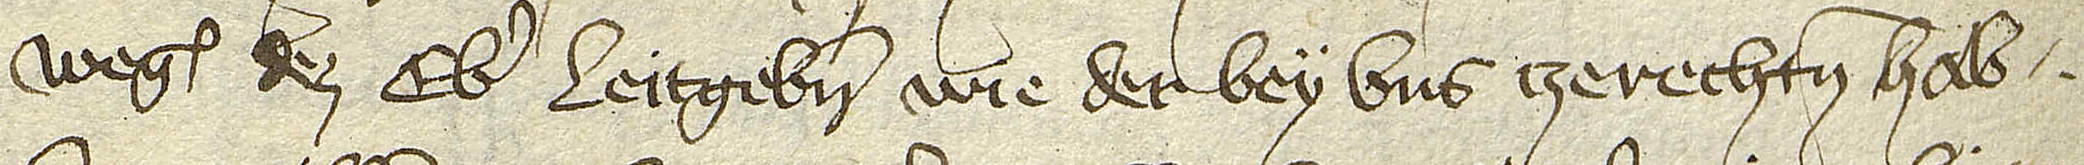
weg* deʒ Eb* Leitgebn* wie der bey vns cʒerechtn* hab / .
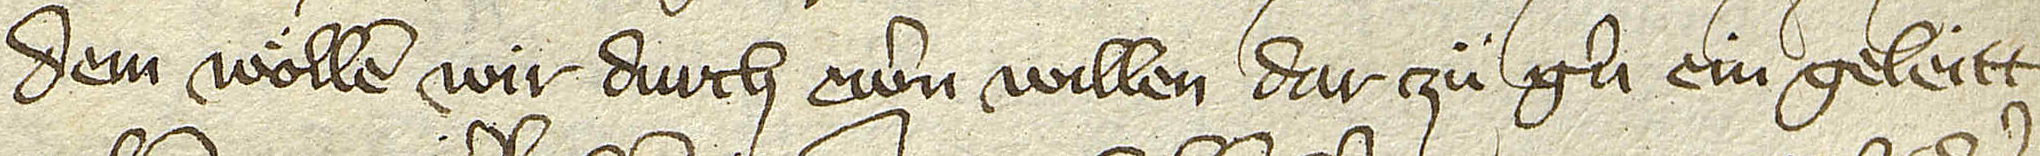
Dem wölle* wir durch ew*n willen dar cʒü g*n ein geleitt
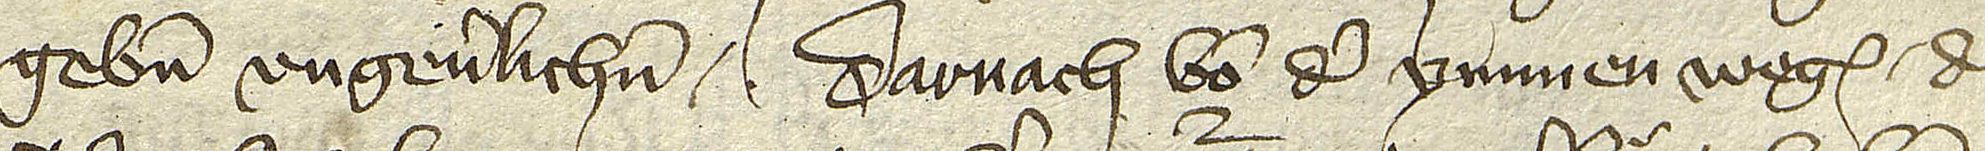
gebn* vngeu*lichn* / . Darnach vo* d* ymmen weg* / d*
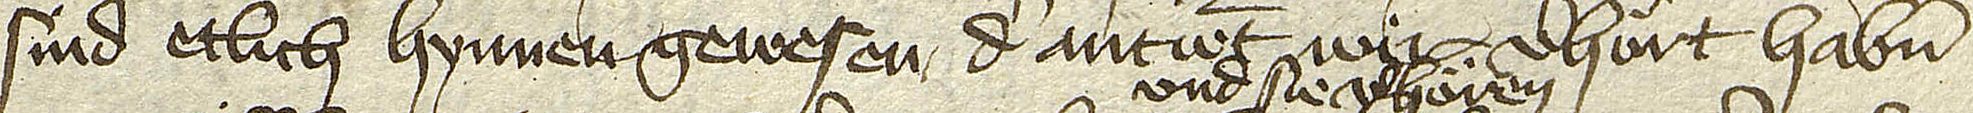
ſind etlich hynnen geweſen / d* antwt* wir v*hört habn*
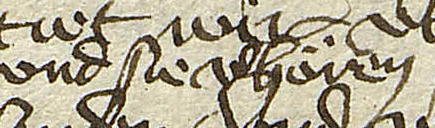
vnd ſie v*hören
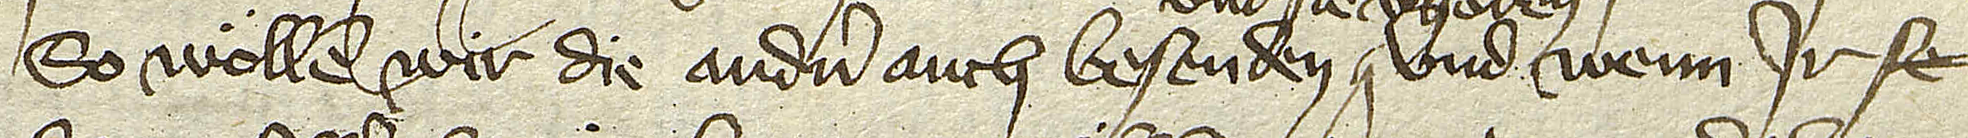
So wölle* wir die andn* auch beſenden / vnd wenn Ir ſe
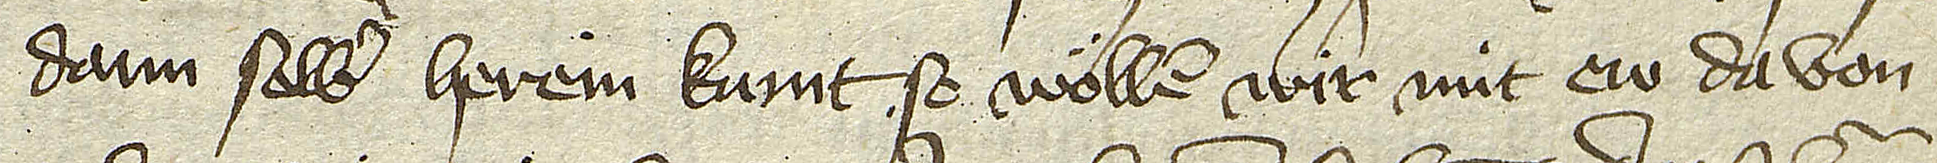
dann ſelb* herein kumt ſo wölle* wir mit ew davon
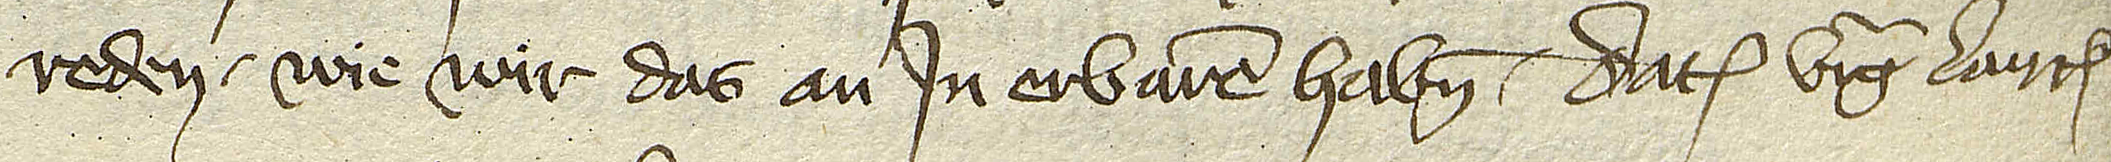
reden / wie wir das an In ervare* habn* / Dat* vig* Laur*
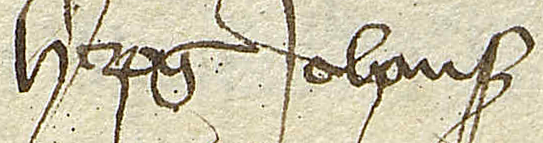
H*cʒog Iohanſ*
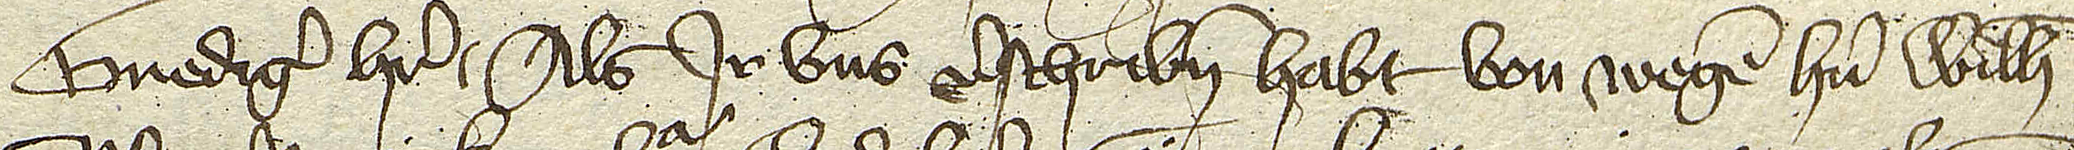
Gnedig* hr* / Als Ir vns v*ſchribn* habt von wege* hn* Wilh*
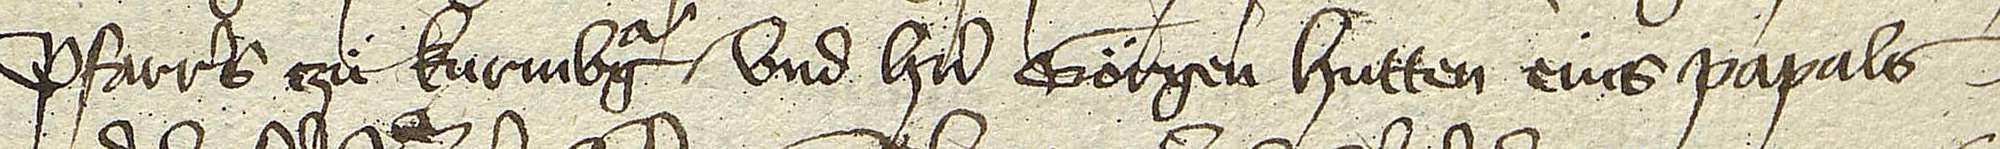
Pfarr*s cʒü kurmb*g / vnd hn* Görgen Hütten eins papals
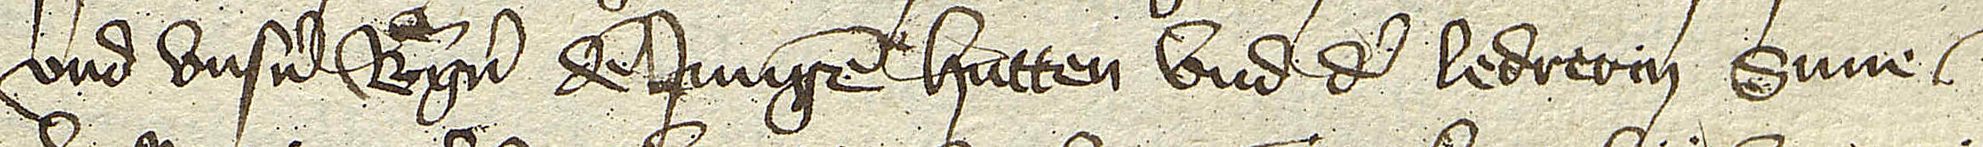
vnd vnſn* B*gn* d* Iunge* Hutten vnd d* ledrerin Sune /
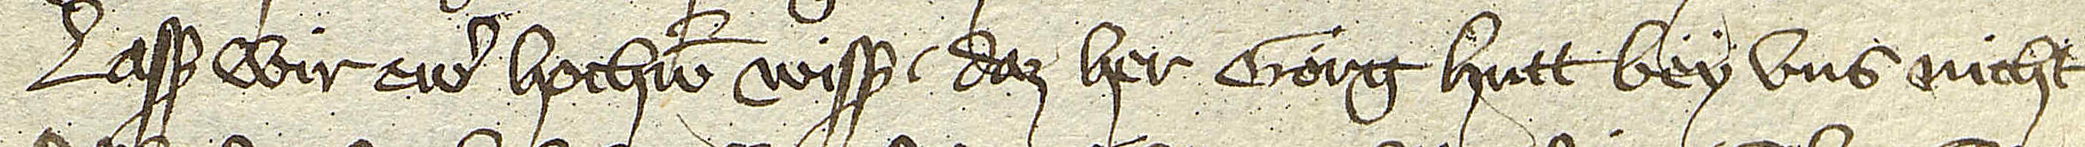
Laſſ* wir ew* hochw* wiſſ* / daʒ her Görg hutt bey vns nicht
